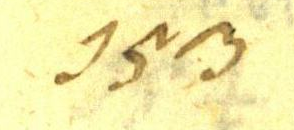153
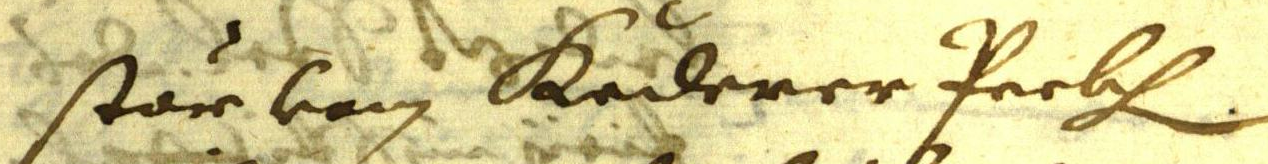stār vom Kederer Peckh
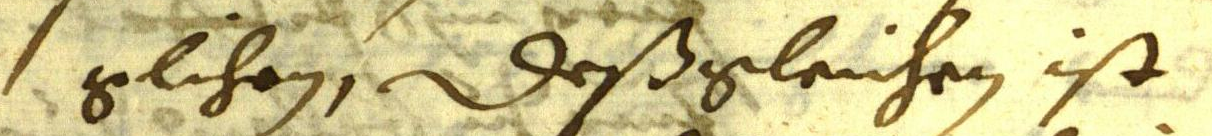glihen, deßgleichen ist
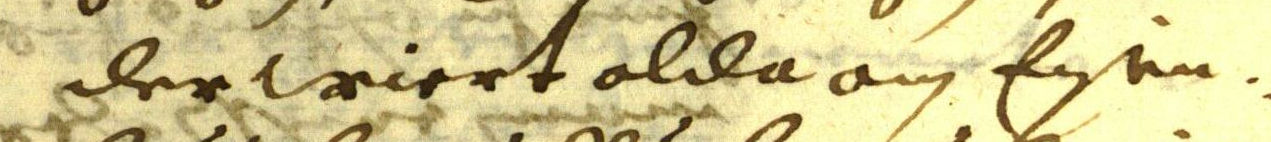der wiert alda am Eisen¬
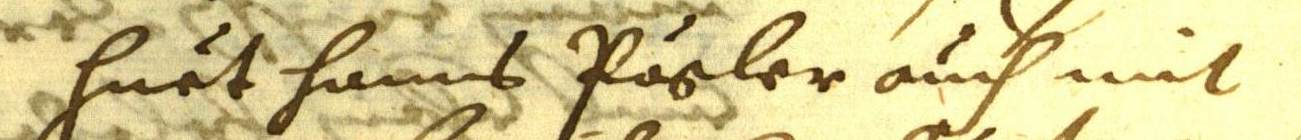hūet hanns Pōgler aūch mit
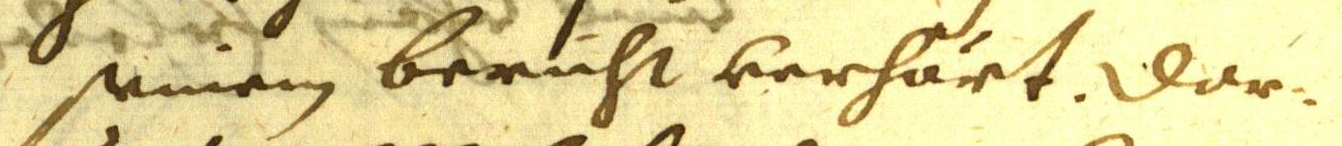seinem bericht verhōrt. dar¬
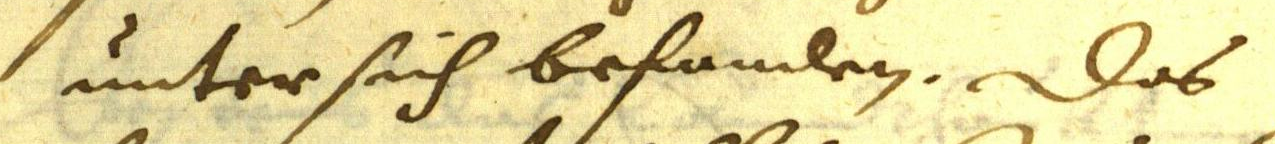ūnter sich befanden. das
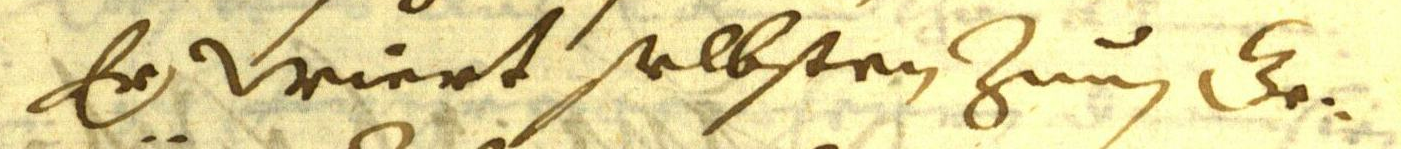Er wiert selbsten Zūm Ge¬
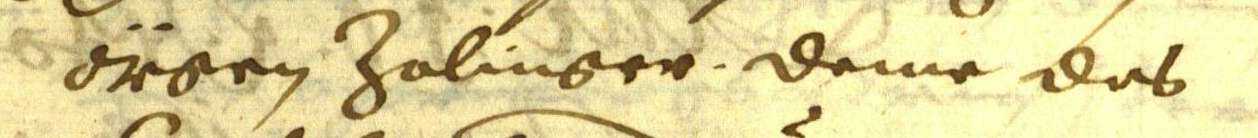örgen Zalinger. deme das
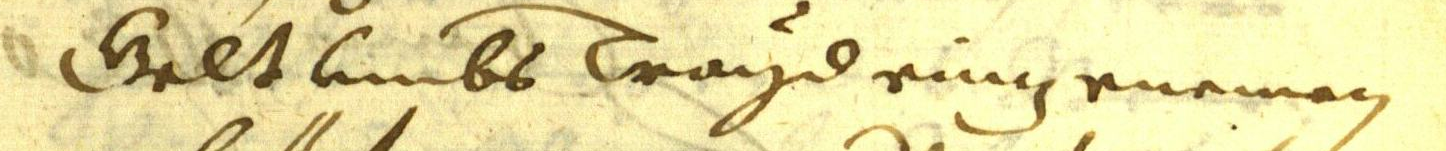Gelt vmbs Traȳd einzenemen
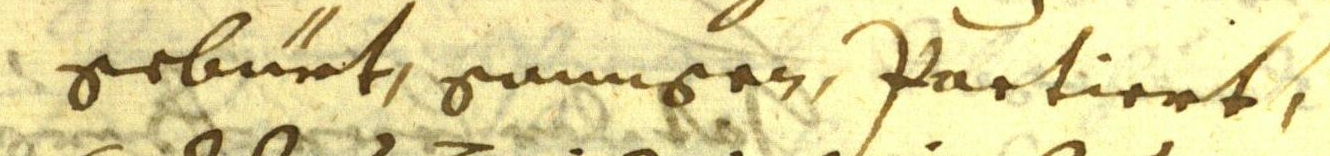gebürt, ganngen, Pactiert,
